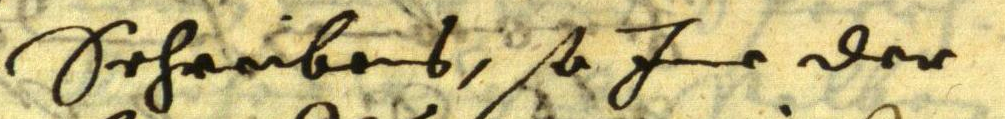Schreibens, so Ime der
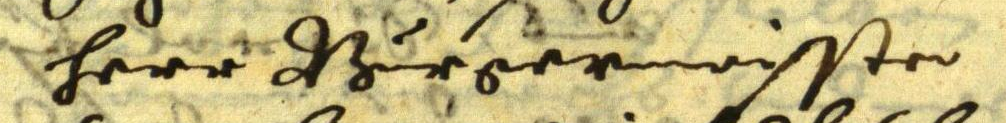herr Būrgermaisster
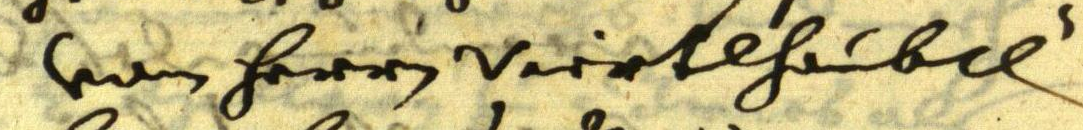vom herrn Viertlhaūbt
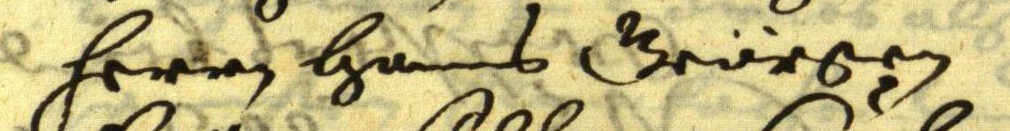herrn Hanns Geörgen
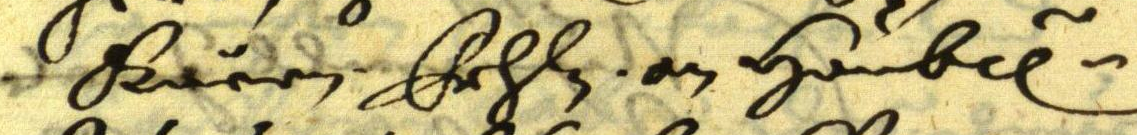Kūeen Frhn. an Haūbt
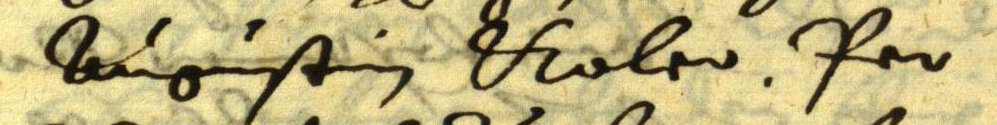Aūgūstin Koler. Per
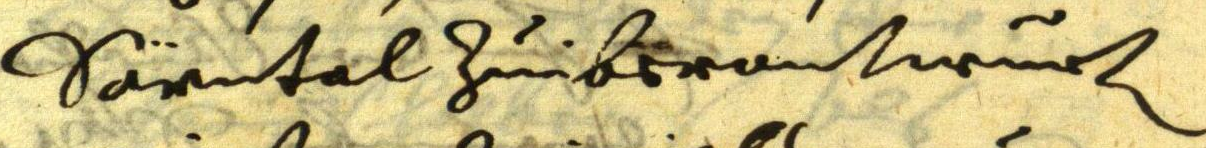Särntal Zūiberantwūrt
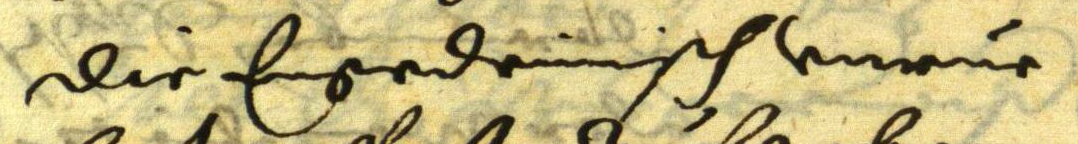die Engedeinisch vnrūe
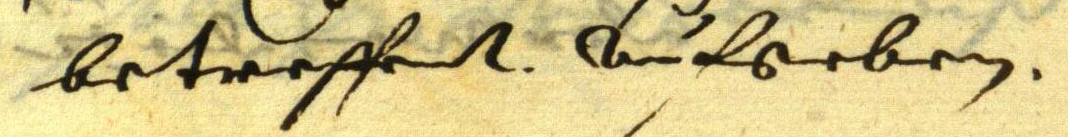betreffent. Aūfgeben.
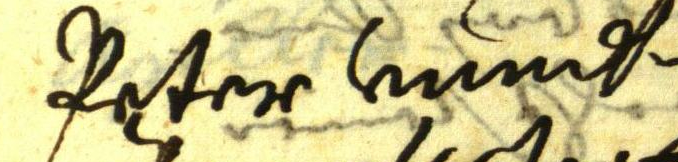Peter Vnndt¬
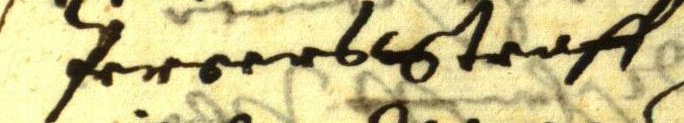Pergers Straff
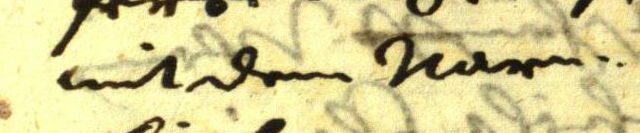mit dem Narn¬
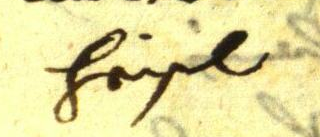heisl
